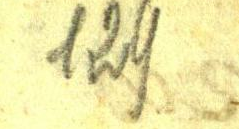129
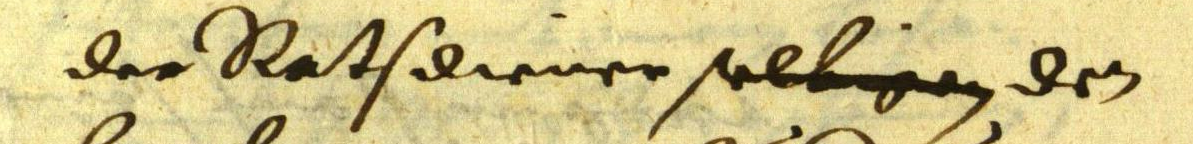der Ratsdiener selbigen den
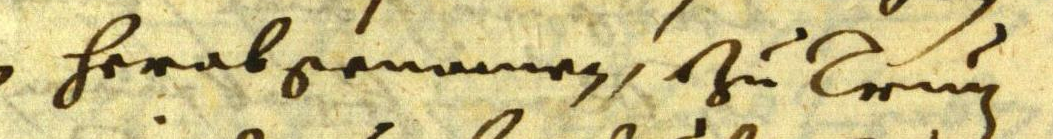herabgenomen, Zū Trūz
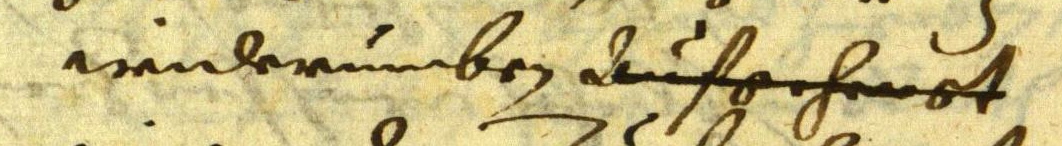widerūmben Aūfgehengt
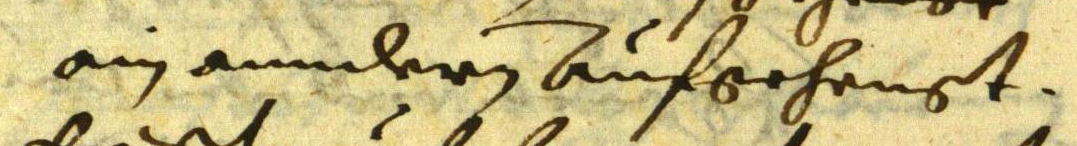ain anndern Aūfgehengt.
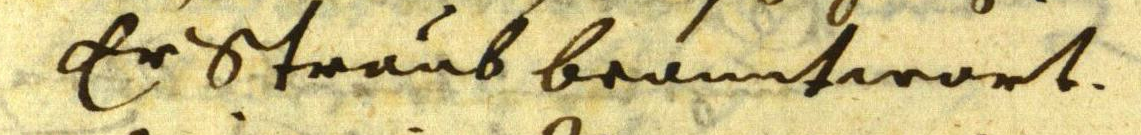Er Straūb beanntwort.
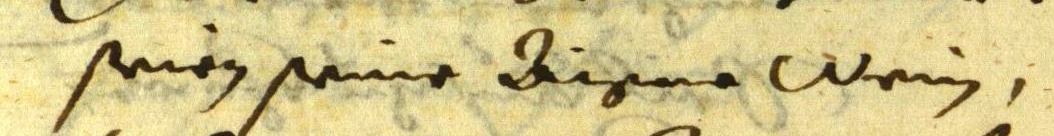seien seine Aigne Wein,
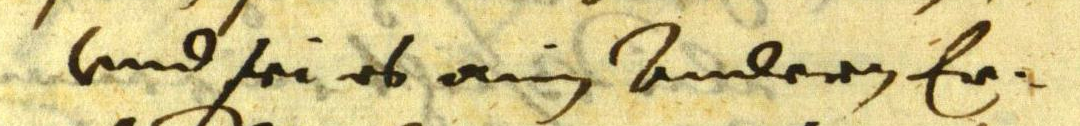vnd sei es aim Anndern Er¬
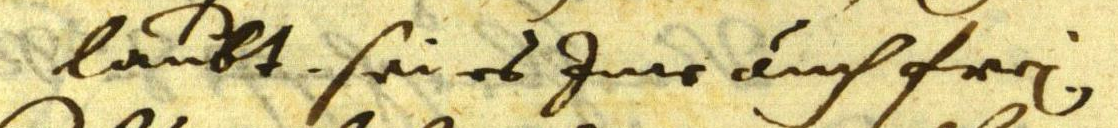laūbt. sei es ime aūch frej.
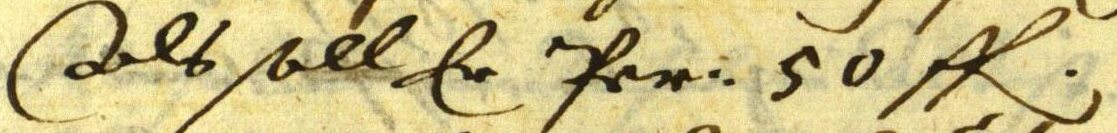Als soll Er Per: 50 fl.
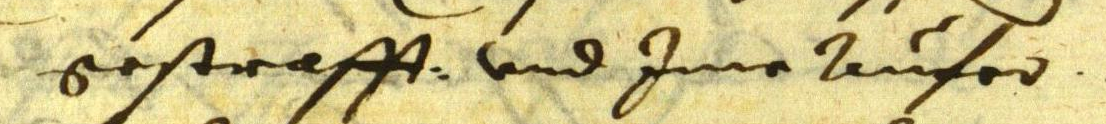gestrafft: vnd Ime Aūfer¬
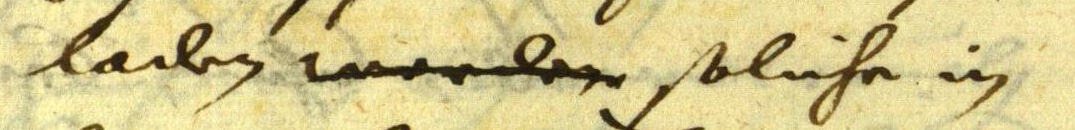laden werden soliche in
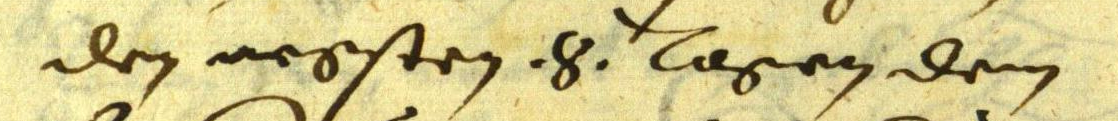den negsten .8. Tagen dem
